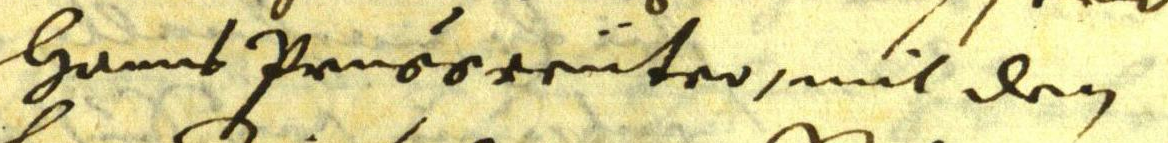Hanns Prūggreūter, mit den
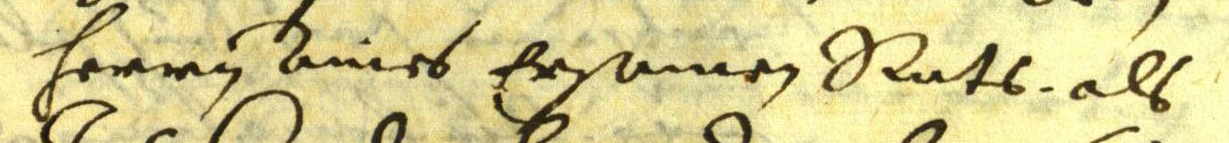herrn Aines Ersamen Rats. als
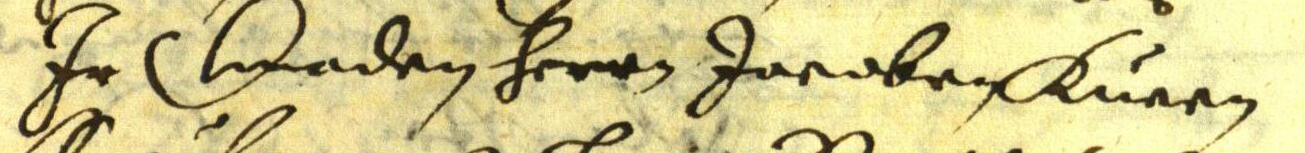Ir Gnaden herrn Jacoben Kūeen
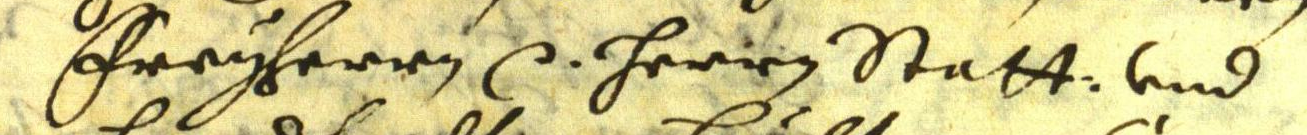Freyherrn etc. herrn Statt- vnd
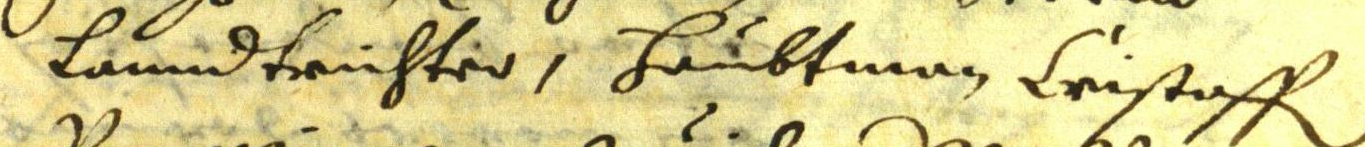Lanndtrichter, haūbtman Cristoff
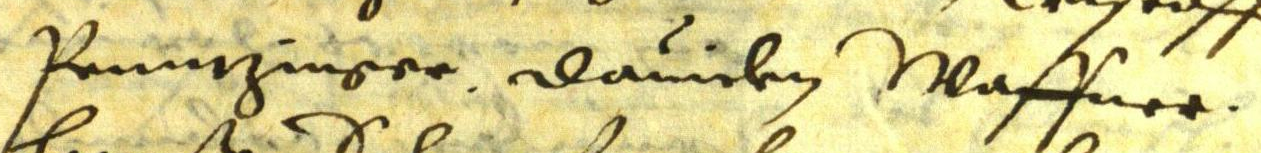Pennzinger. Daūiden Waffner.
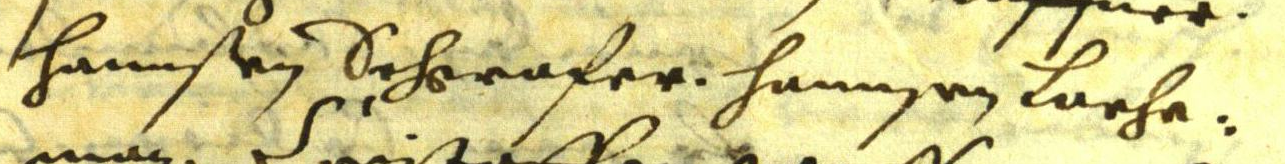Hannsen Schgrafer. hannsen Loche¬
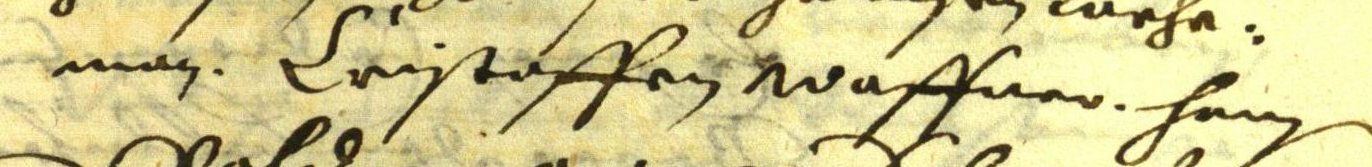man. Cristoffen Waffner. hans
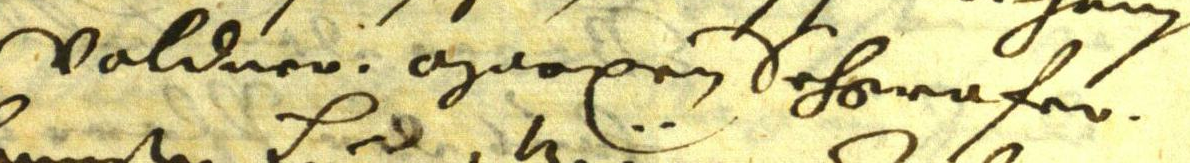Waldner. Marxen Schgrafer.
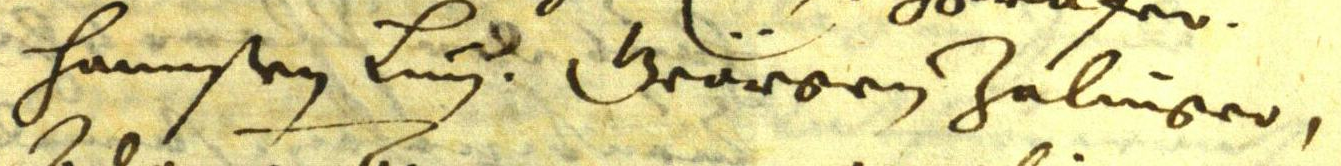Hannsen Lūn. Geörgen Zalinger,
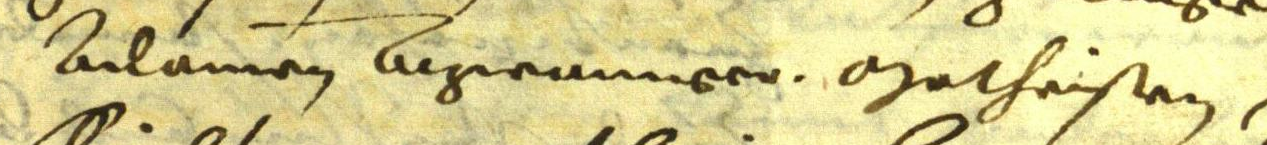Adamen Azwannger. Matheisen
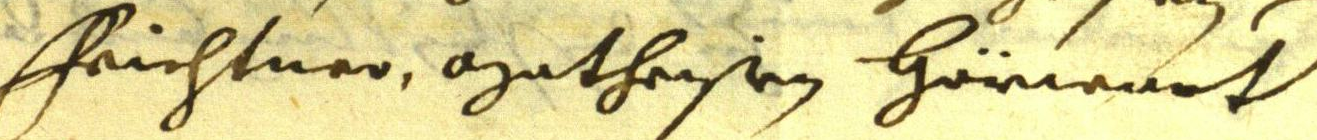Feichtner, Matheisen Hörwart
